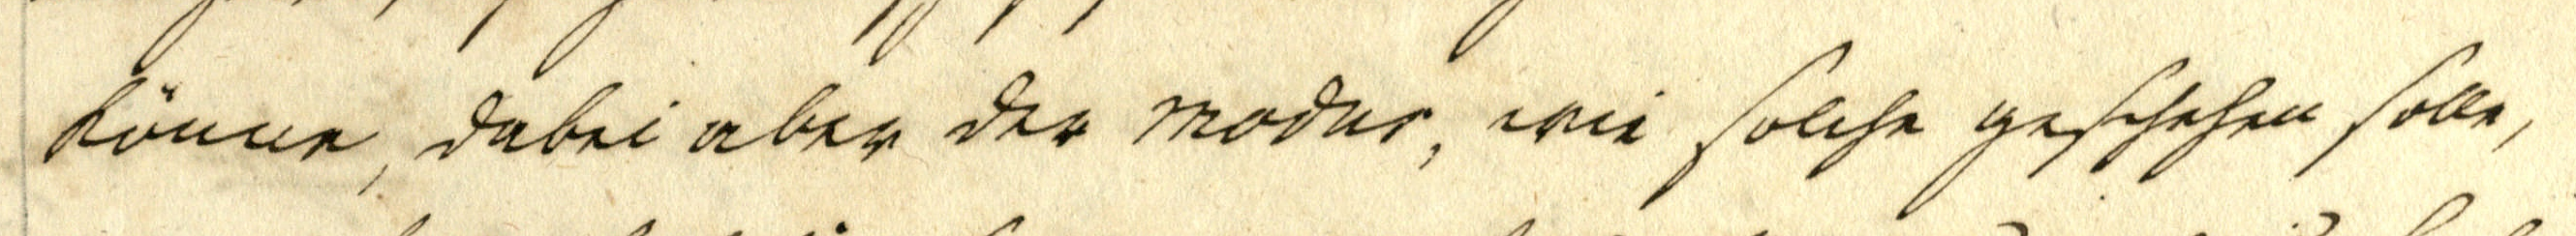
könne, dabei aber der modus, wie solche geschehen solle,
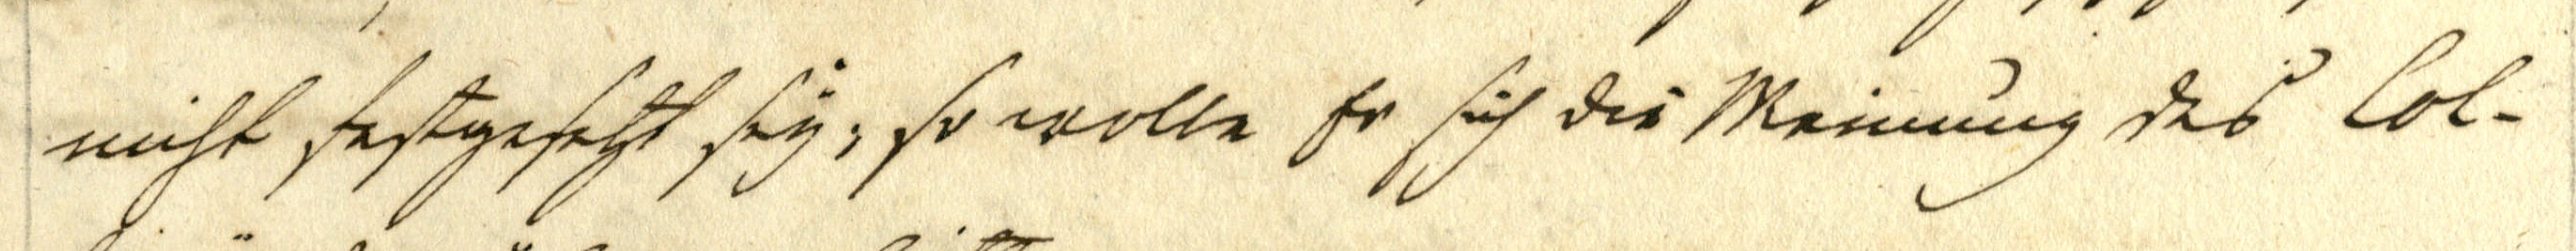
nicht festgesetzt seÿ, so wolle Er sich die Meinung des Col¬
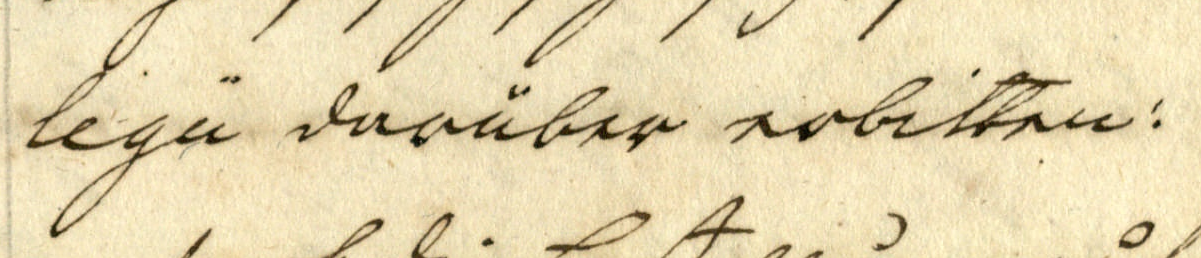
legii darüber erbitten.
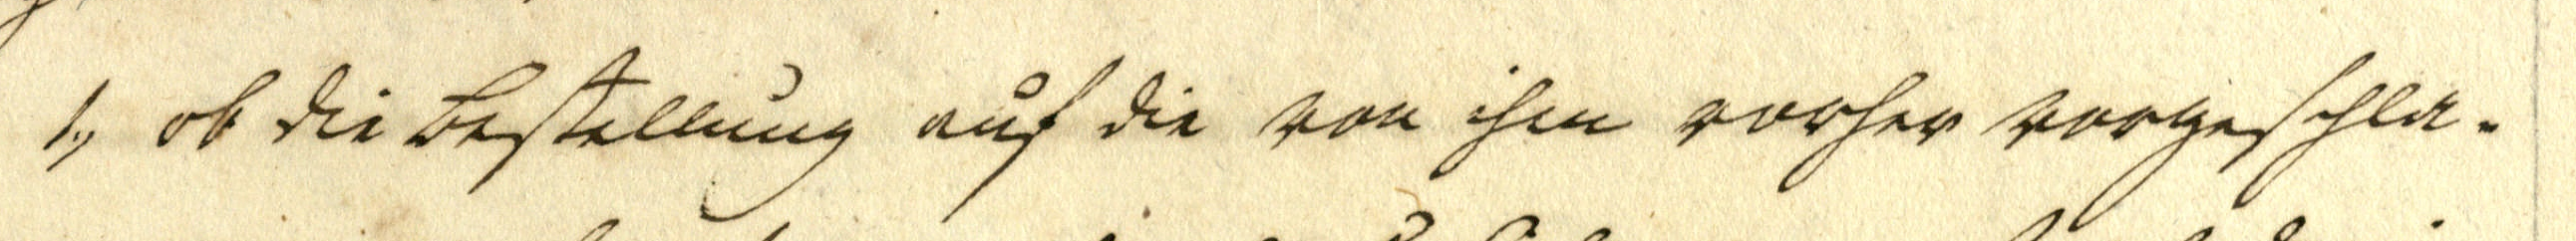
1., ob die Bestellung auf die von ihm vorher vorgeschla¬
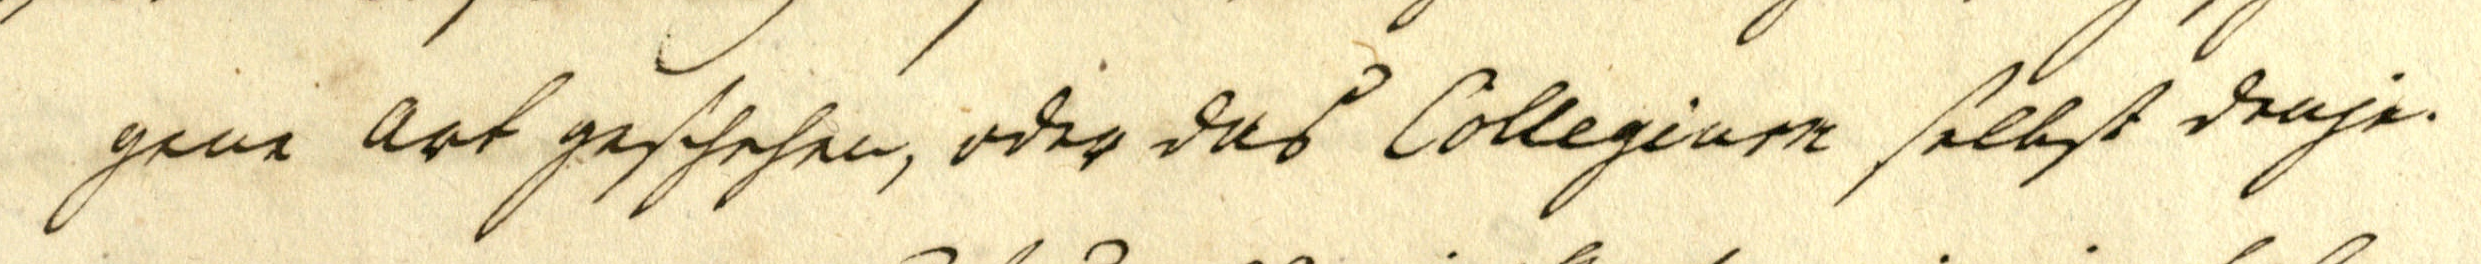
gene Art geschehen, oder das Collegium selbst denje¬
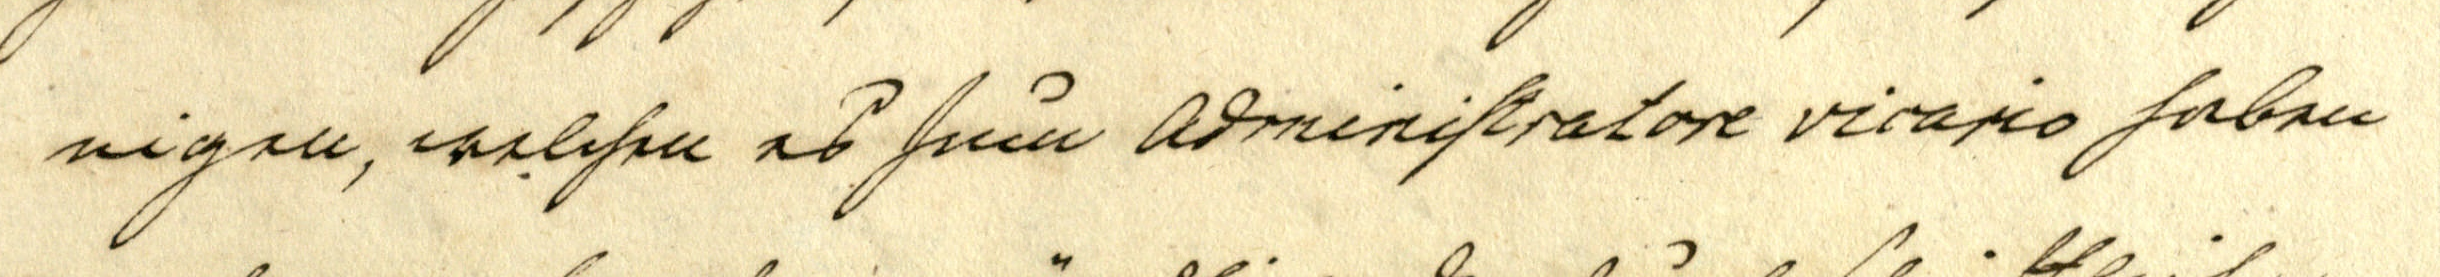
nigen, welchen es zum Administratore vicario haben
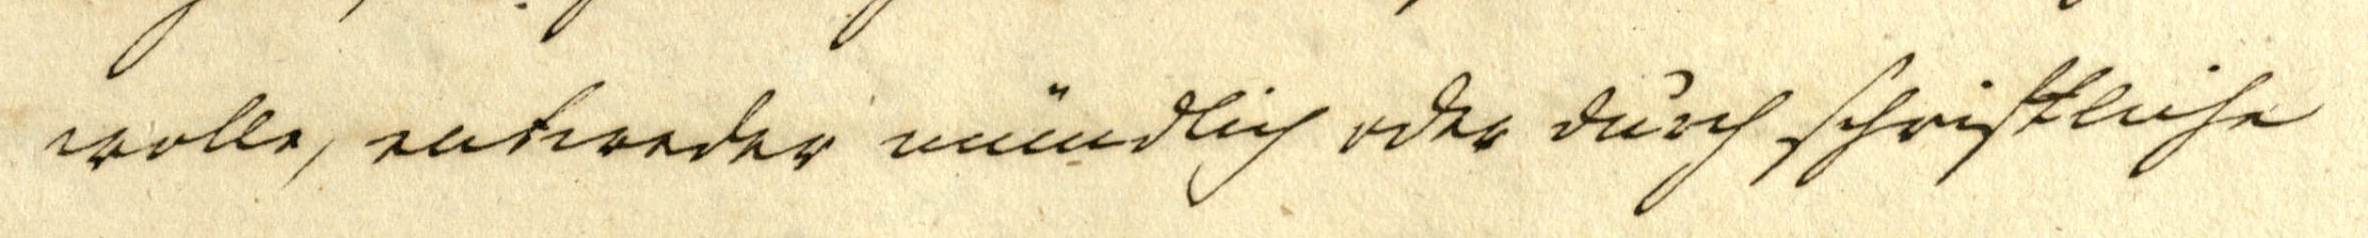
wolle, entweder mündlich oder durch schriftliche
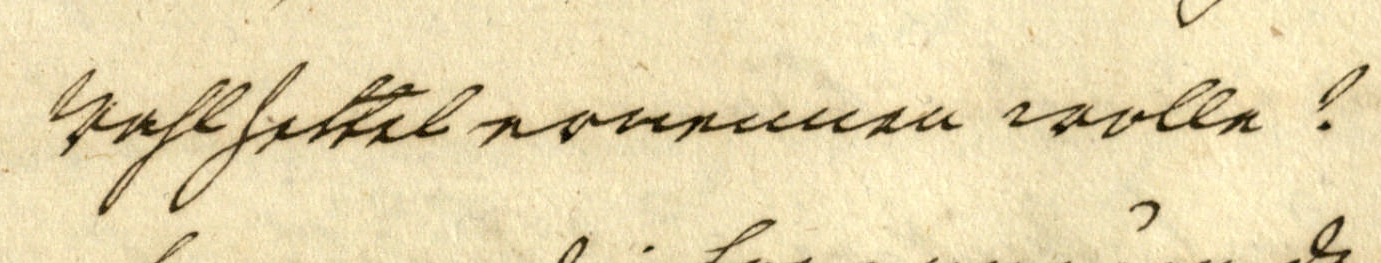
Wahlzettel ernennen wolle?
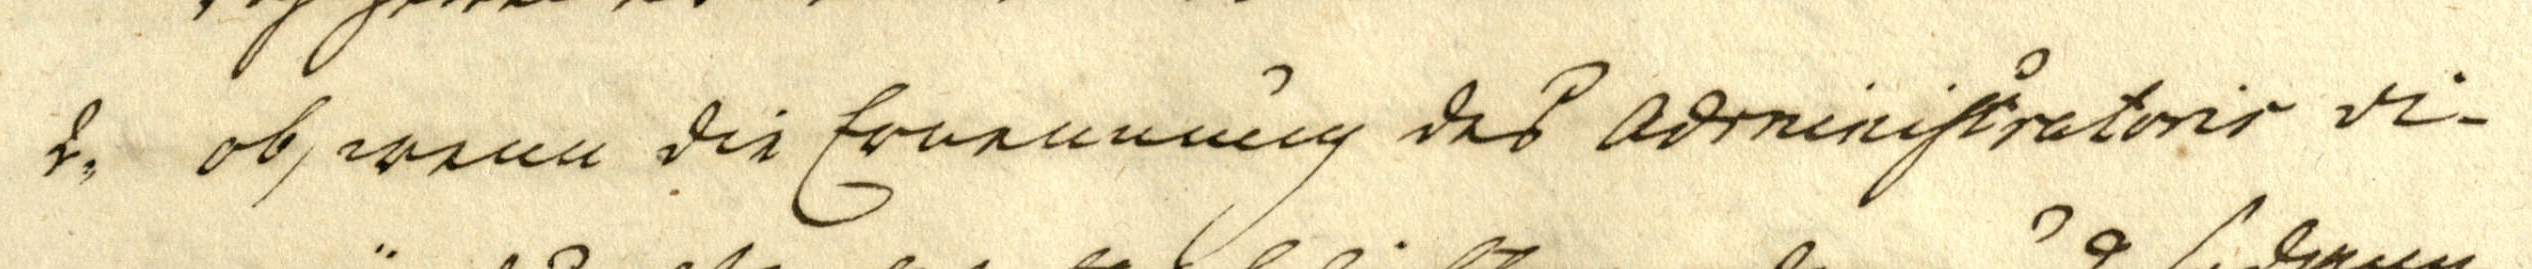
2. ob, wenn die Ernennung des Adeministratoris vi¬
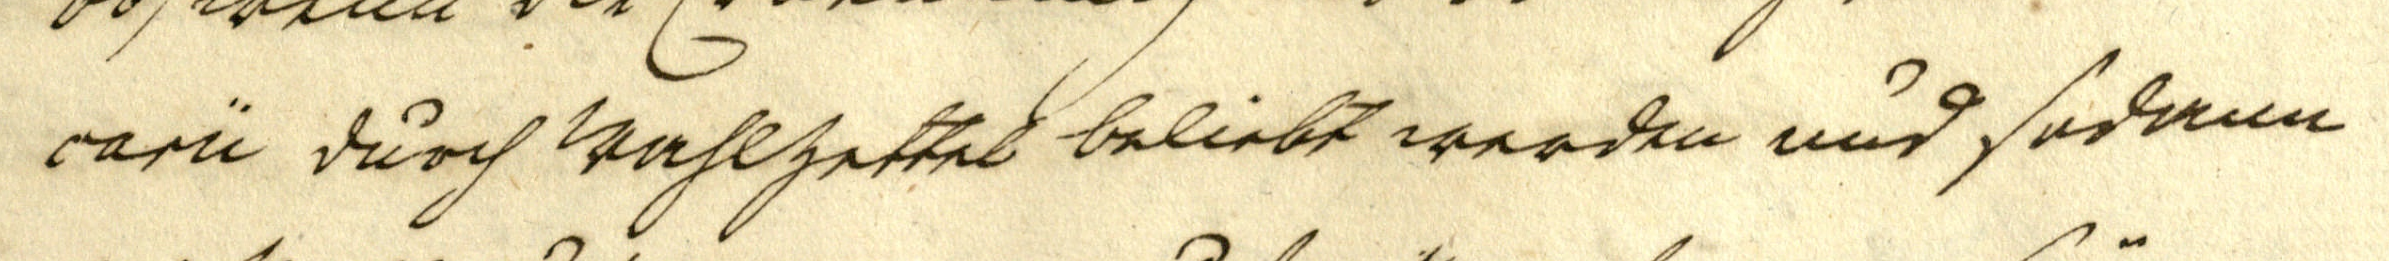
carii durch Wahlzettet beliebt werden und sodann
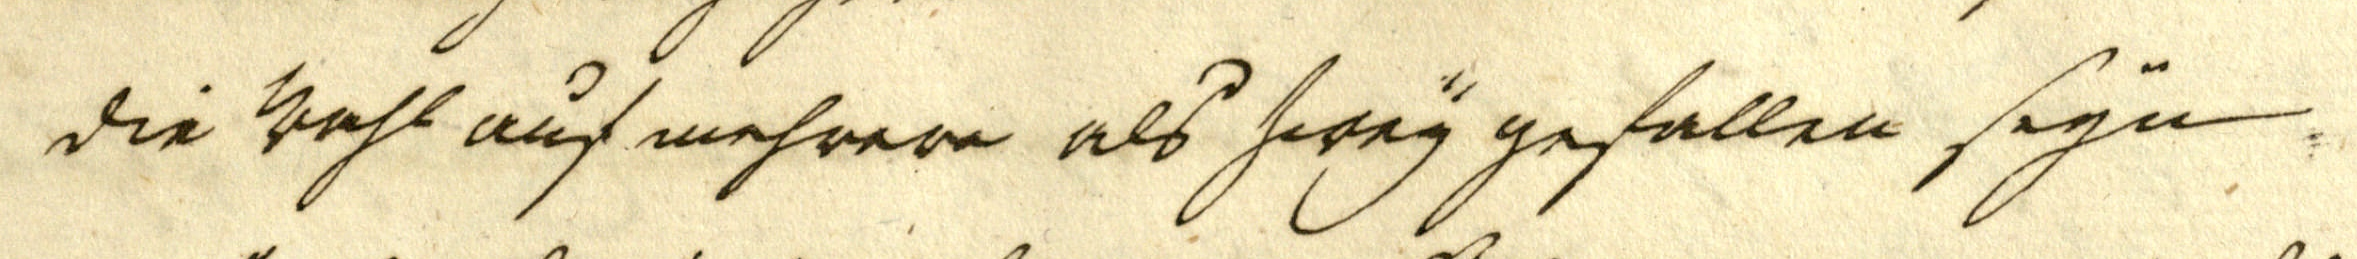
die Wahl auf mehrere als zweÿ gefallen seÿn
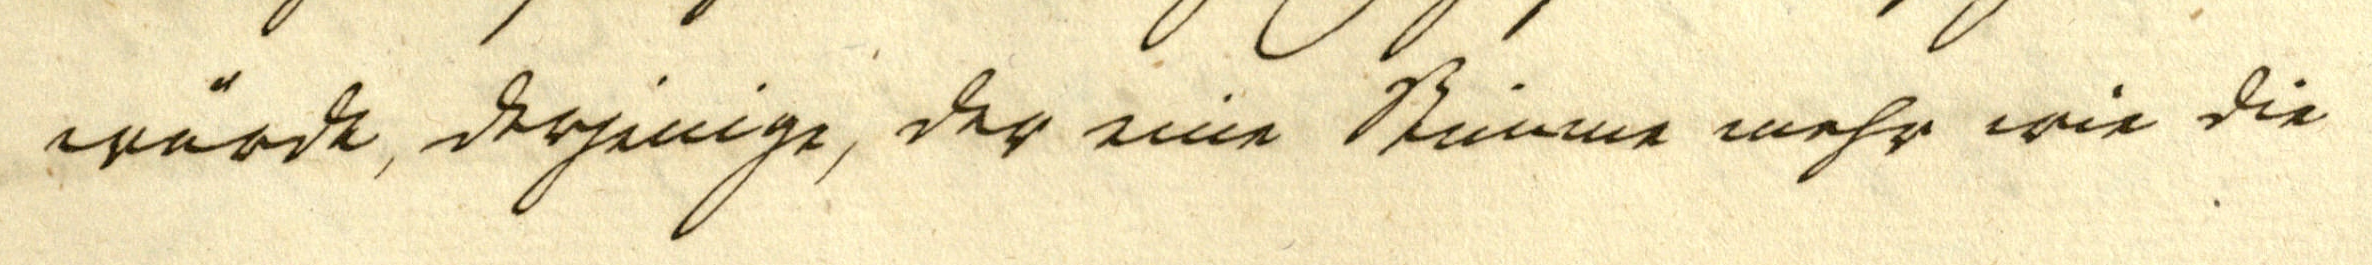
würde, derjenige, der eine Stimme mehr wie die
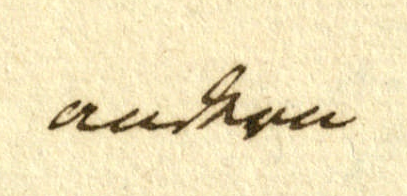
andern
